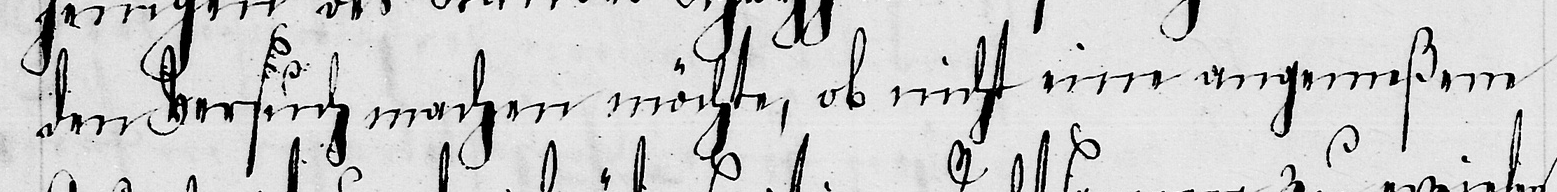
den Versuch machen möchte, ob nicht eine angemeßene
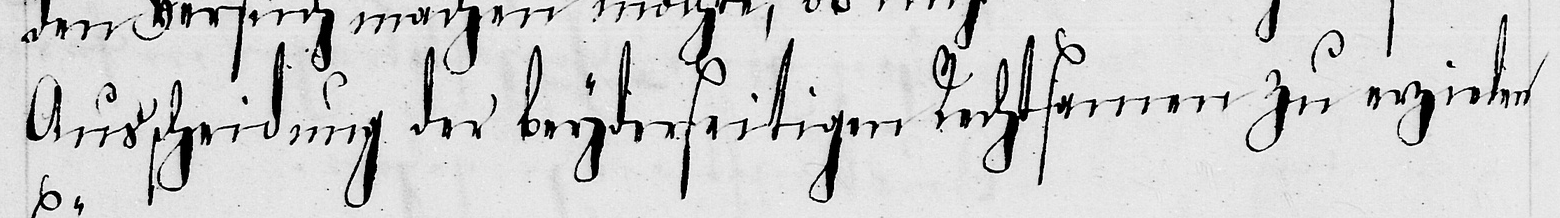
Ausscheidung der beyderseitigen Rechtsamen zu erzielen
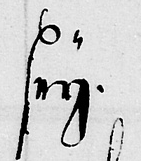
ey.
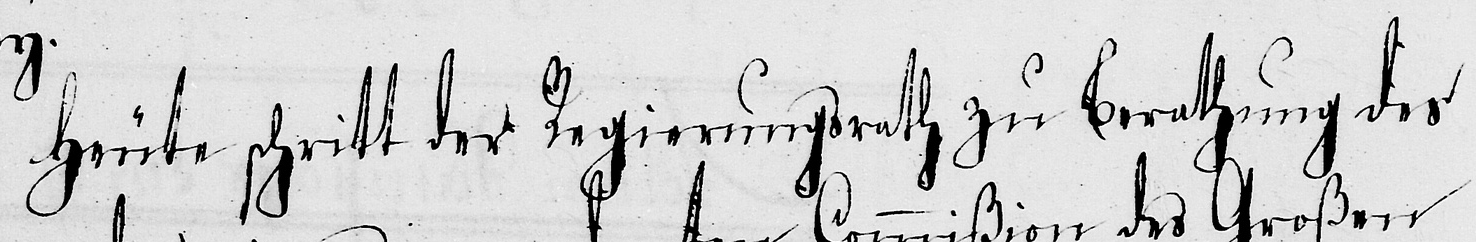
Heute schritt der Regierungsrath zu Berathung des
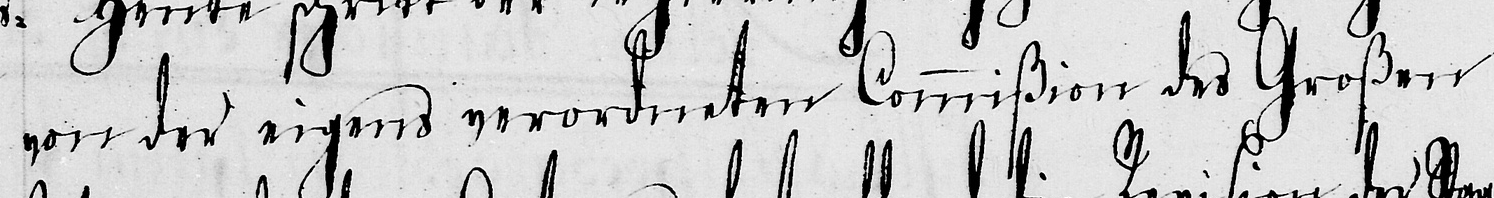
von der eigens verordneten Commißion des Großen
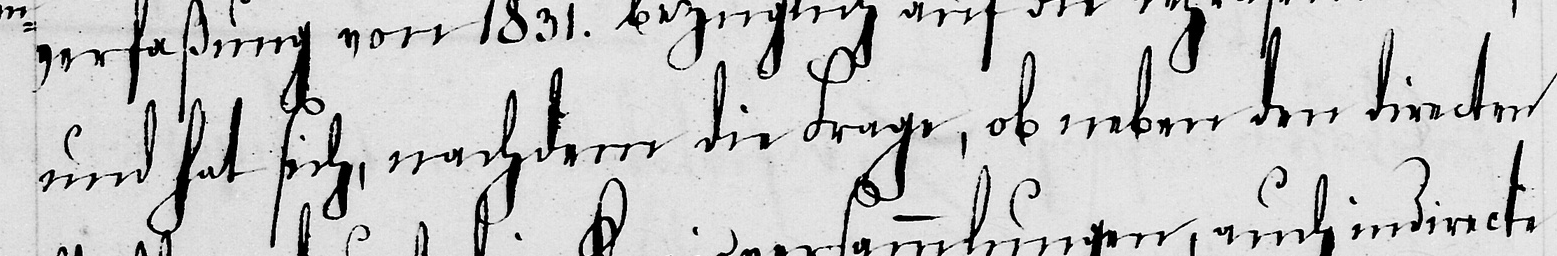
und hat sich, nachdem die Frage, ob neben den directen
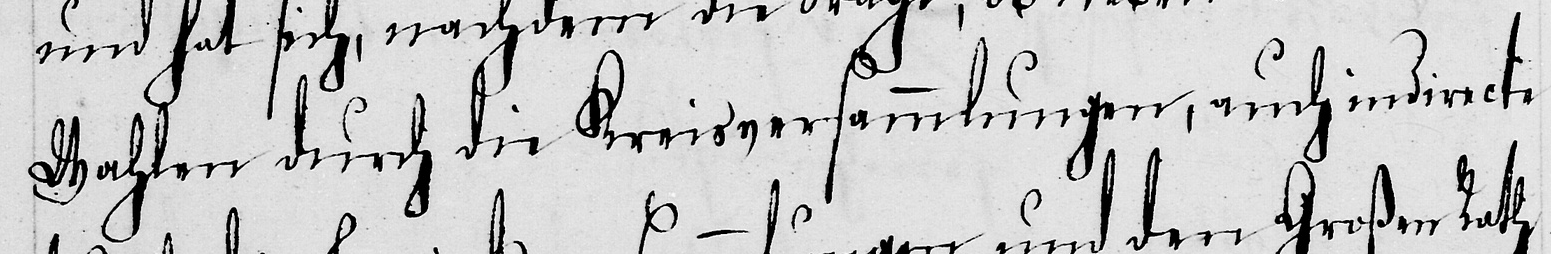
Wahlen durch die Kreisversammlungen, auch indirecte
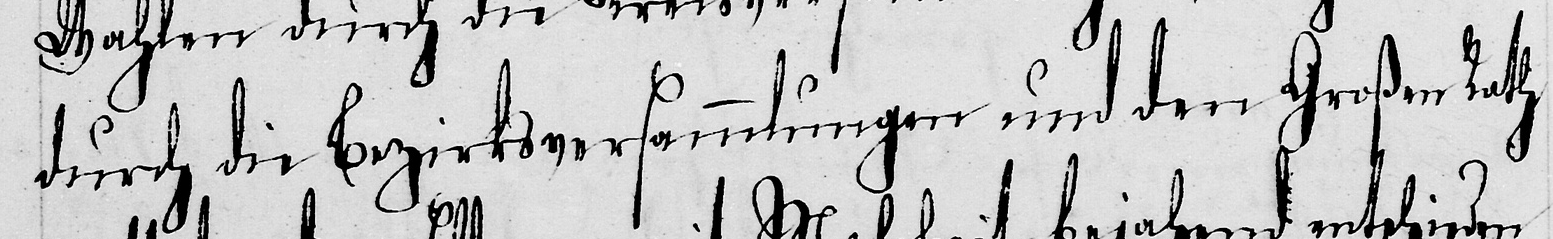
durch die Bezirksversammlungen und den Großen Rath
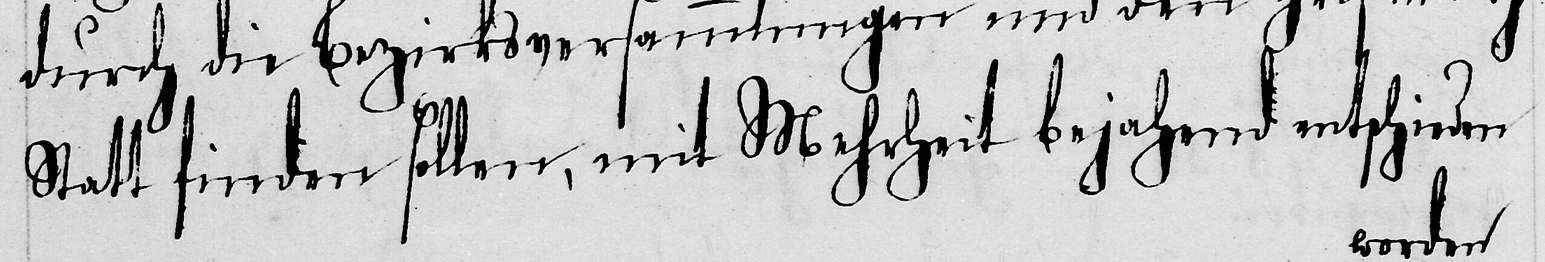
Statt finden sollen, mit Mehrheit bejahend entschieden
